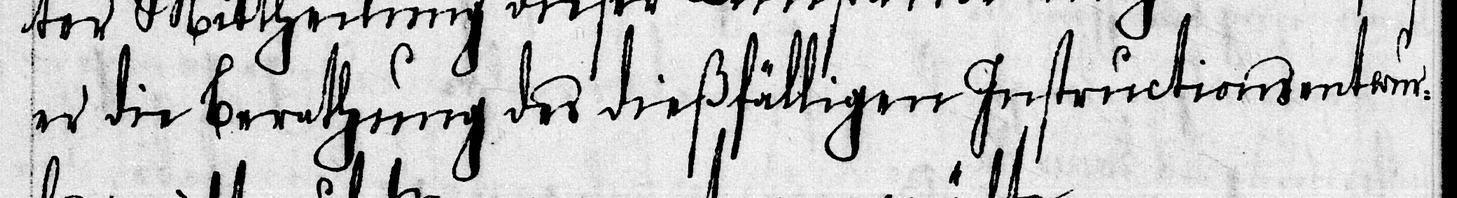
er die Berathung des dießfälligen Instructionsentwur¬
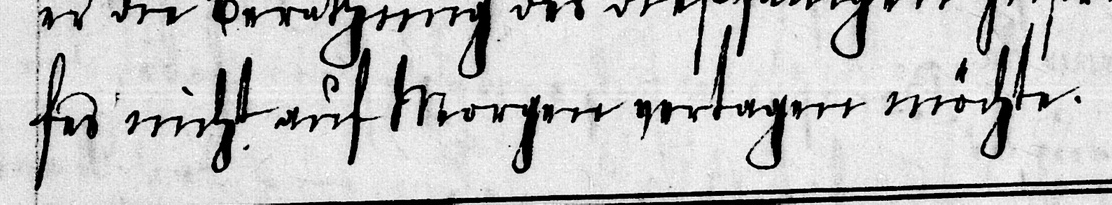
fes nicht auf Morgen vertagen möchte.
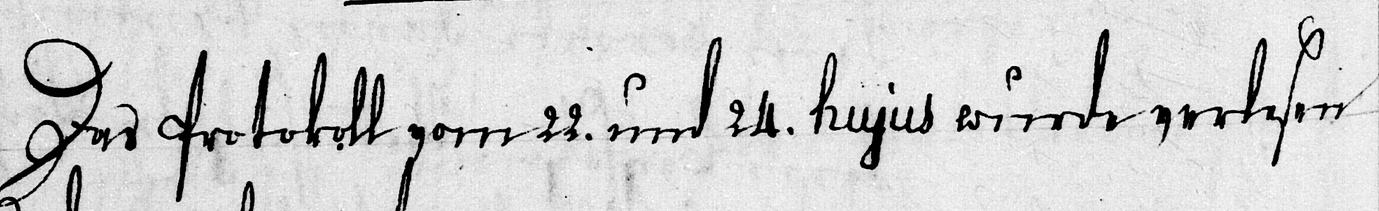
Das Protokoll vom 22 und 24. hujus wurde verlesen
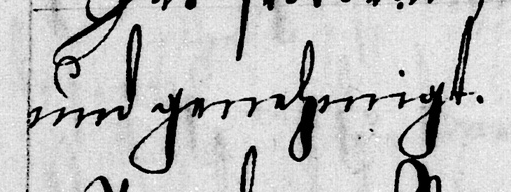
und genehmigt.
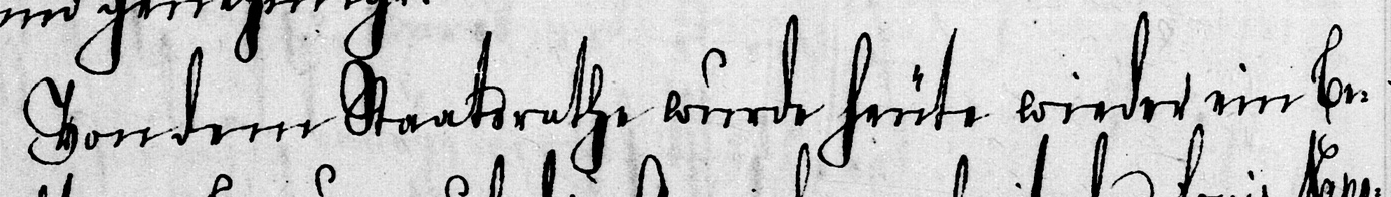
Von dem Staatsrathe wurde heute wieder ein Be¬
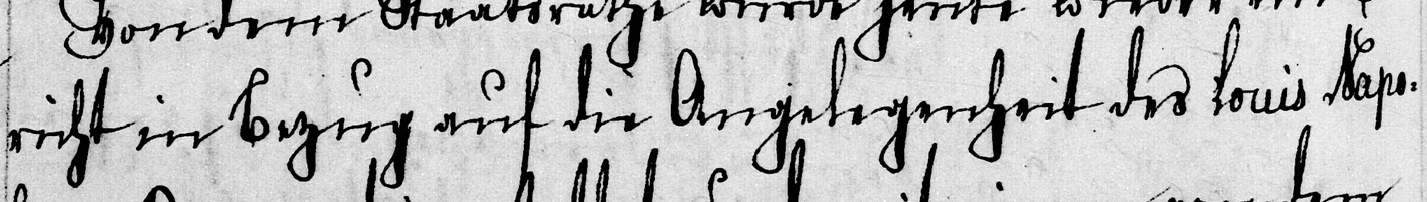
richt in Bezug auf die Angelegenheit des Louis Napo¬
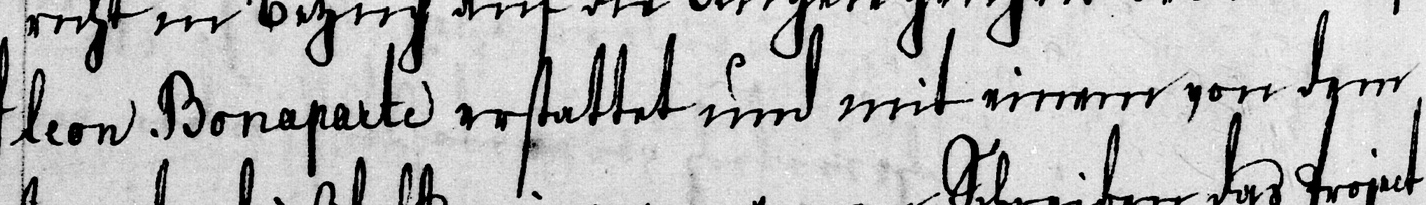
leon Bonaparte erstattet und mit einem von dem
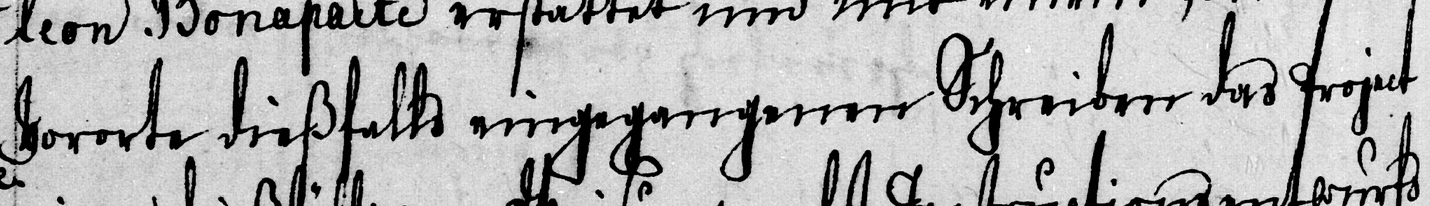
Vororte dießfalls eingegangenen Schreiben das Project
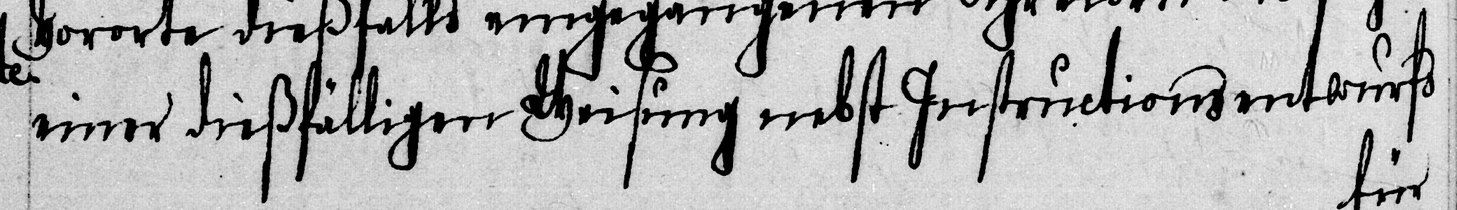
einer dießfälligen Weisung nebst Instructionsentwurfs
